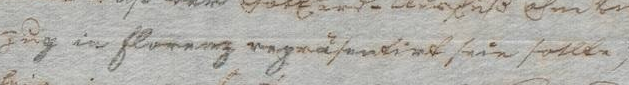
zug in Florenz repräsentirt sein sollte,
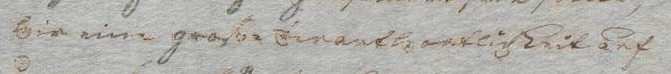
wir eine große Verantwortlichkeit auf
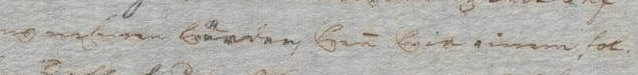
uns nehmen würden, wenn wir einem sol-
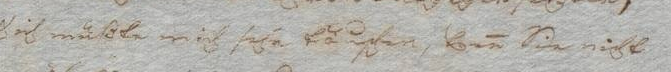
ich müßte mich sehr täuschen, wenn Sie nicht
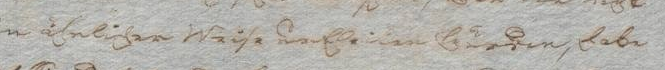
in ähnlicher Weise urtheilen würden, habe
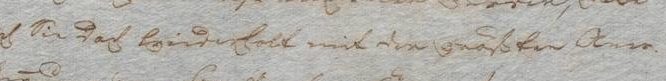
ich Sie doch wiederholt mit der größten Aner-
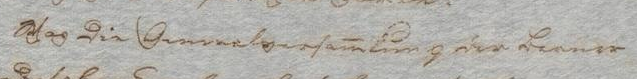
Was die Generalversammlung der Berner
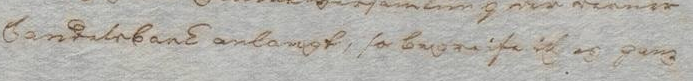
Handelsbank anlangt, so begreife ich es ganz
